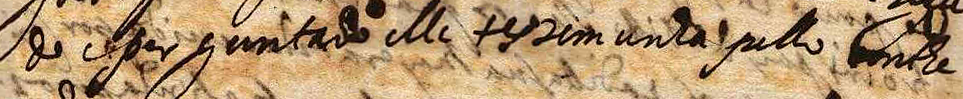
do e perguntado elle testemunha pello conthe
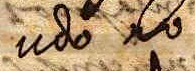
udo no
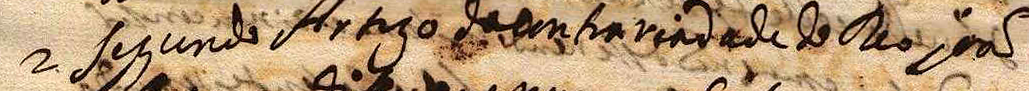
2 segundo Artigo da contrariadade do Reo joaõ
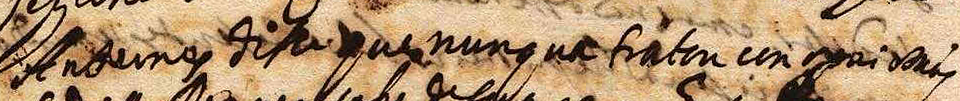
Antunes disse que nunqua tratou con o pai e maj
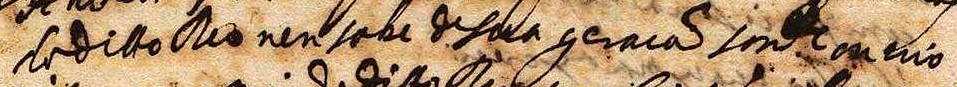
do ditto Reo nem sabe de sua geraçaõ som.te ouuio
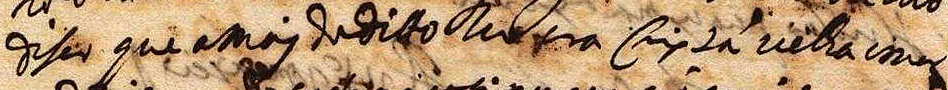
diser que a maj do ditto Reo era Cristā uelha e mais
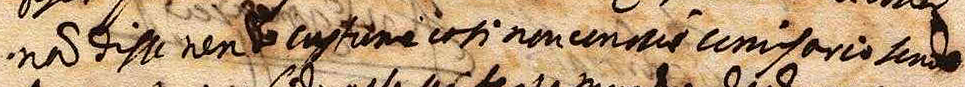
naõ disse nen do custume e asinou con o sor̄ comisario sendo
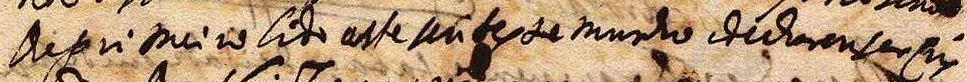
lhe primeiro lido este seu testemunho e declarou ser Cris
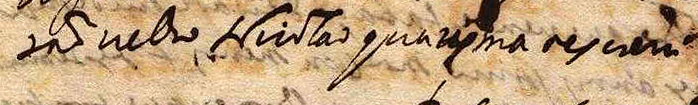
taõ uelho Nicolao quaresma o escreui
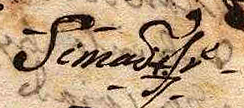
Simaõ fre
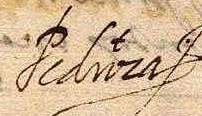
Pedroza
